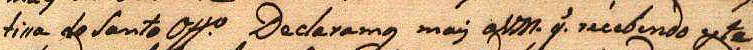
tissa do santo Off.o Declaramos mais a VM. q̄ recebendo esta
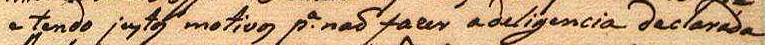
e tendo justos motivos p.a naõ fazer a deligencia declarada
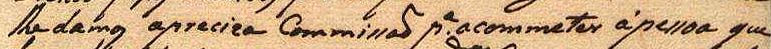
lhe damos a preciza Commissaõ p.a a commeter á pessoa que
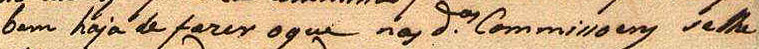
bem haja de fazer o que nas d.as Commissoens selhe
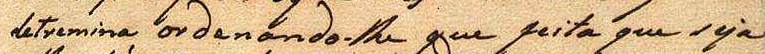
detremina, ordenando-lhe, que feita que seja
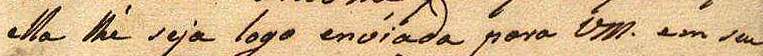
ella lhe seja logo enviada para VM. em seu
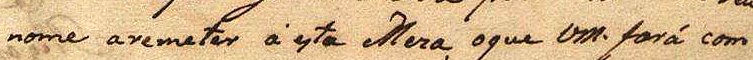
nome a remeter á esta Meza, o que VM. fará com
